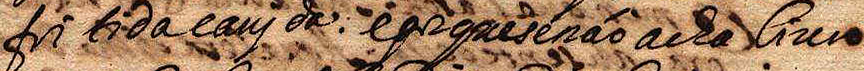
foi tida e aujda. e porque se naõ acha liuro
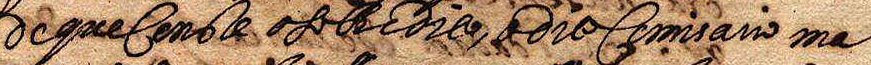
de que Conste o sobredito, o dito Comisario ma
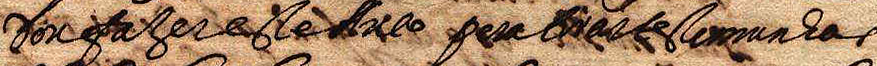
dou fazer este Auto pera tirar testemunhas
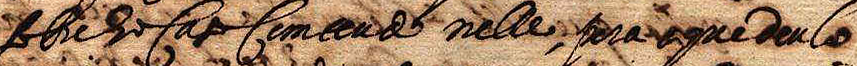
sobre ho Caso Comteudo nelle, pera o que deu lo
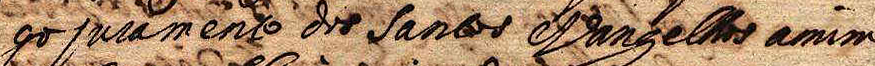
go juramento dos santos eVangelhos a mim
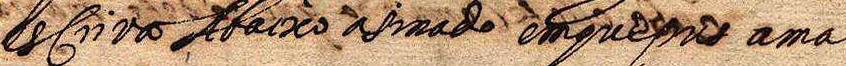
esCrivaõ Abaixo asinado em que pus a ma
